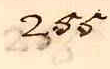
255
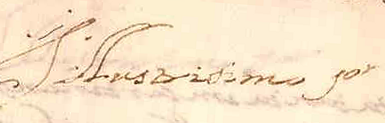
Jllustrisimo Sor
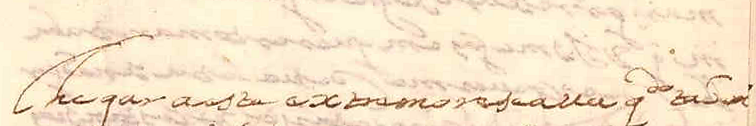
Chegar a este extremo reseaua qdo taõ em
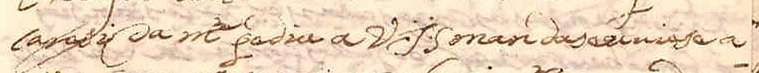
caresidamte pedia a V. J.S mandase ou uiese a
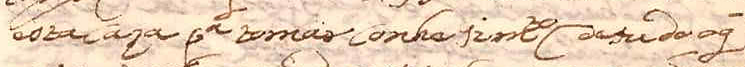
esta caza pa tomar conhesimto de tudo o q̄
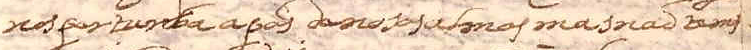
nos perturba a pas de nosas almas mas naõ temos
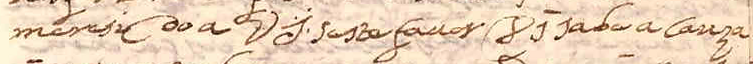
meresido a V J.S. este fauor Ds̄ sabe a cauza
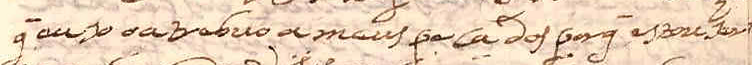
q̄ eu so o atrebuo a meus pecados porq̄ estou ser
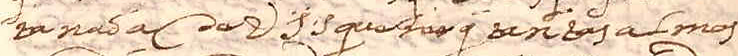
ta naõ ade V J.S que ter q̄ tantas almas
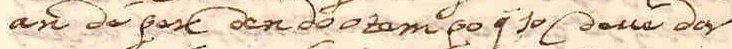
ande perdendo o tempo q̄ se deue dar
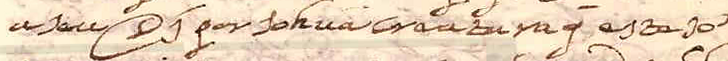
a seu Ds̄ por o huā creatura q̄ este sor
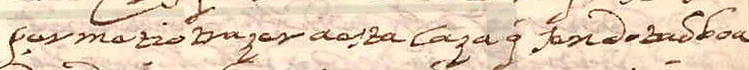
permetio trazer a esta caza q̄ sendo taõ boa
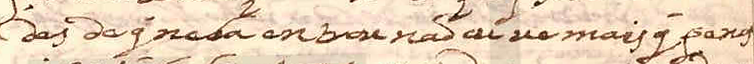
desde q̄ nela entrou naõ ouue mais q̄ penas
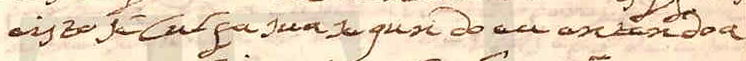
e isto sē Culpa sua segundo eu entendo a
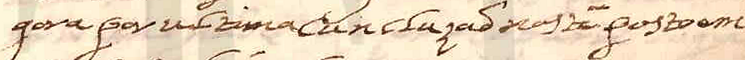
gora por ultima cuncluzaõ nos tē posto em
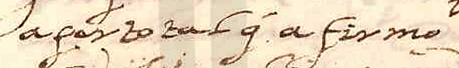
aperto tal q̄ afirmo
